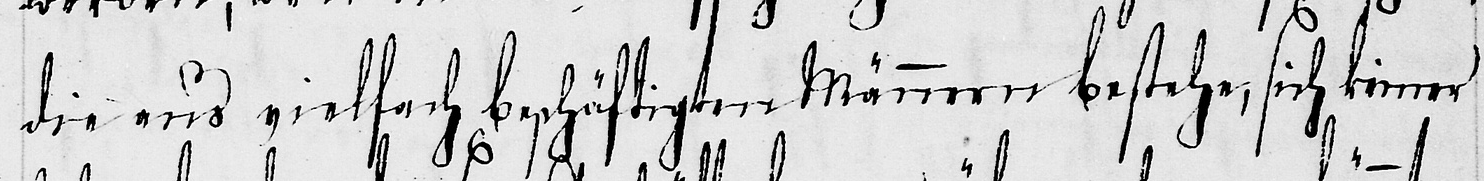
die aus vielfach beschäftigten Männern bestehe, sich keiner
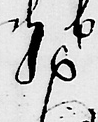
M.
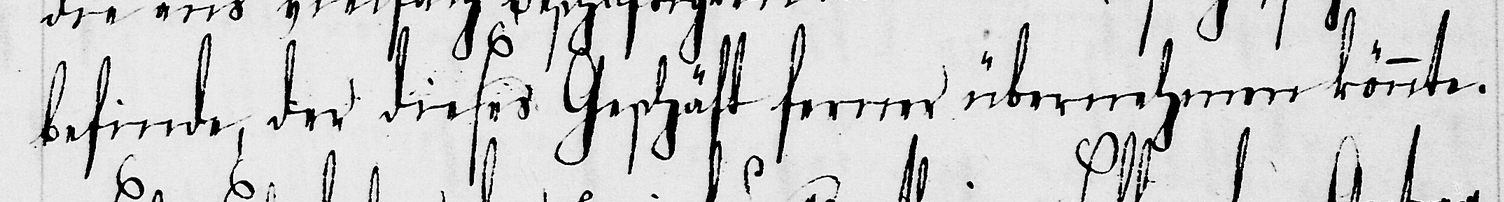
befinde, der dieses Gechäft ferner übernehmen könnte.
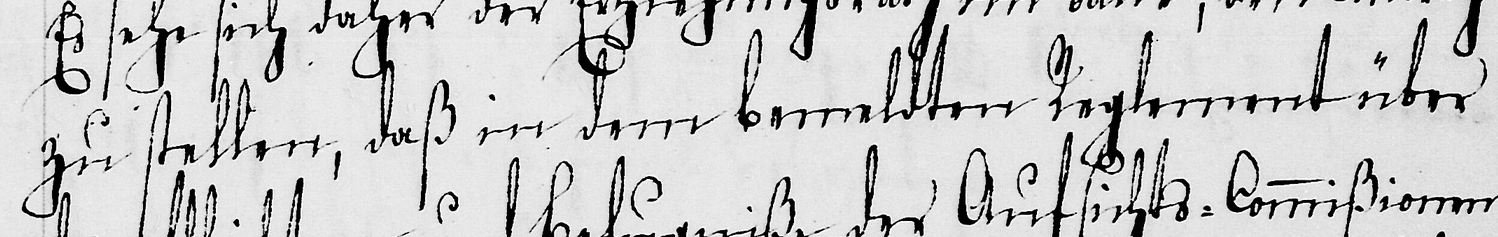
zu stellen, daß in dem bemeldten Reglement über
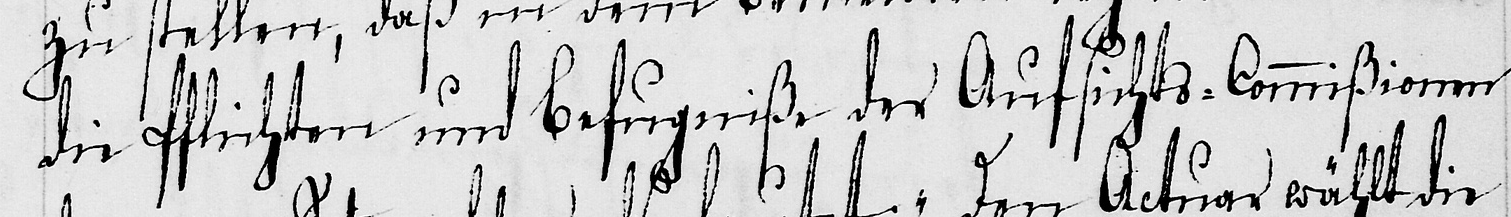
die Pflichten und Befugniße der Aufsichts-Commißion¬
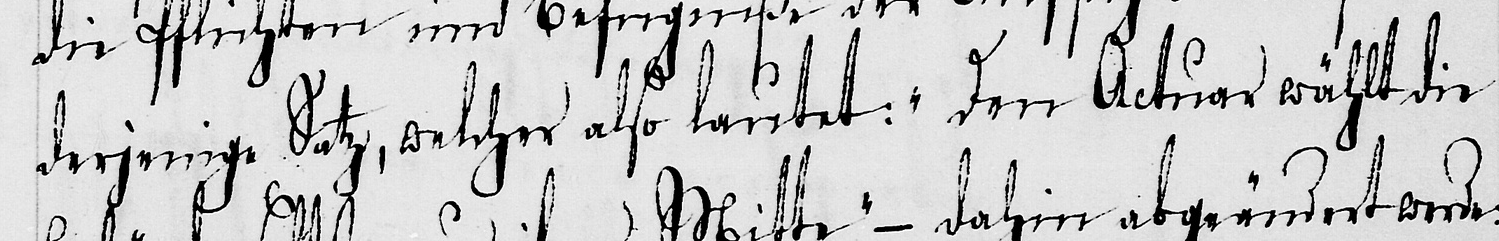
derjenige Satz, welcher also lautet: „Den Actuar wählt die
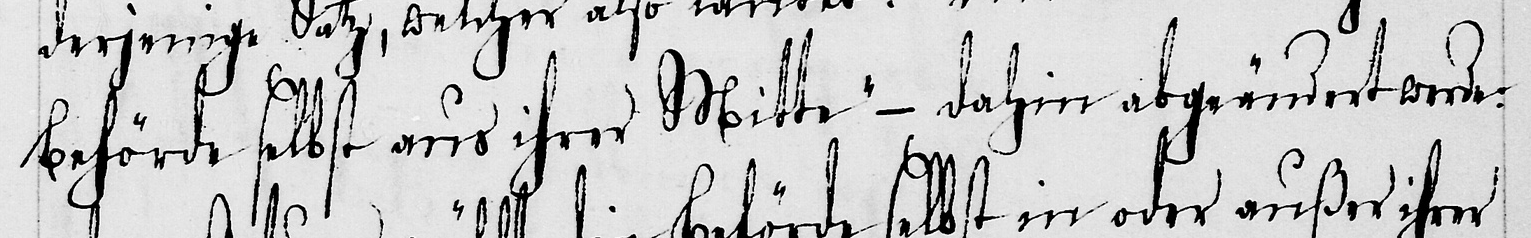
Behörde selbst aus ihrer Mitte“ – dahin abgeändert werde:
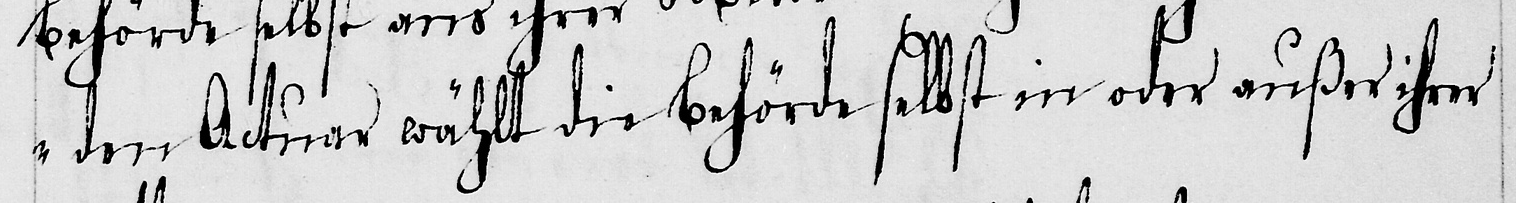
„den Actuar wählt die Behörde selbst in oder außer ihrer
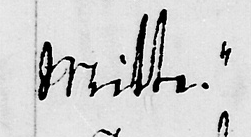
Mitte.“
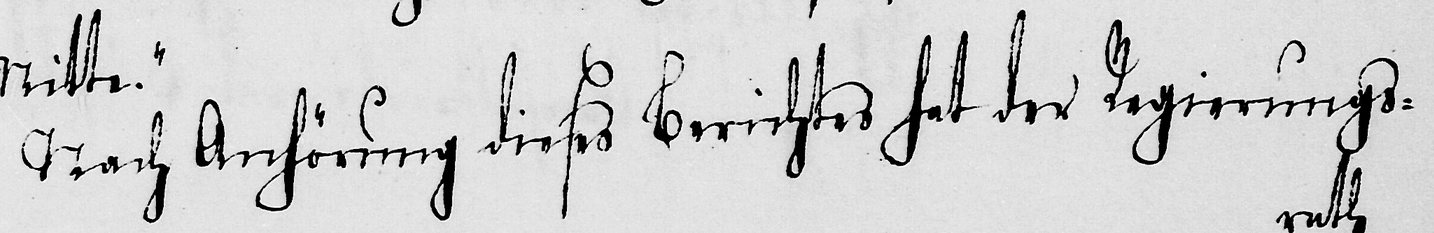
Nach Anhörung dieses Berichtes hat der Regierungs-
